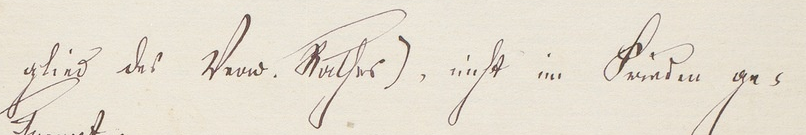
glied des Verw.Rathes), nicht in Frieden ge-
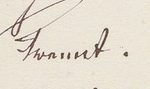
trennt.
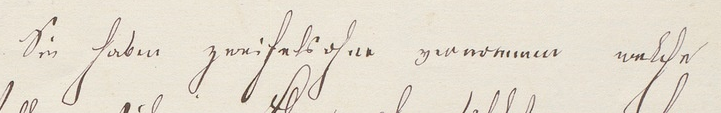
Sie haben zweifelsohne vernommen welche
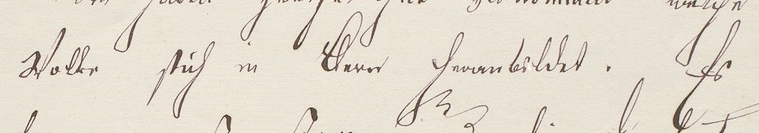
Wolke sich in Bern heranbildet. Es
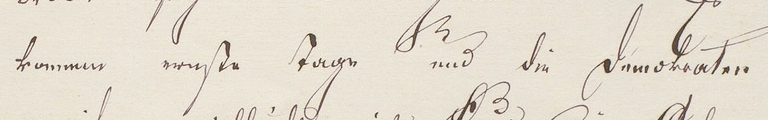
kommen ernste Tage und die Demokraten
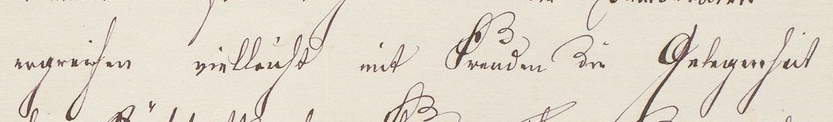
ergreifen vielleicht mit Freuden die Gelegenheit
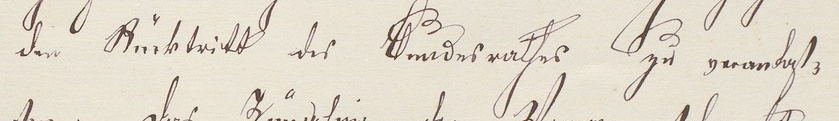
den Rücktritt des Bundesrathes zu veranlas-
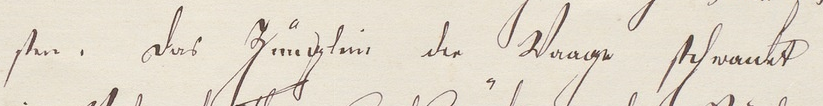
sen. Das Zünglein der Waage schwankt
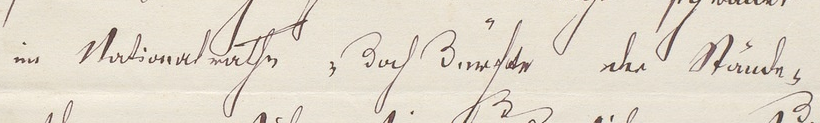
im Nationalrathe, doch dürfte der Stände-
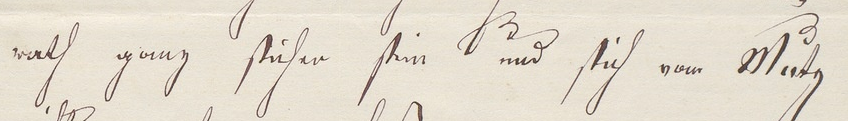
rath ganz sicher sein und sich vom Mutz
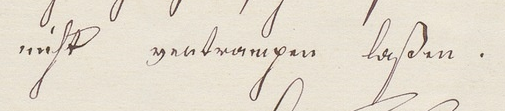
nicht vertrampen laßen.
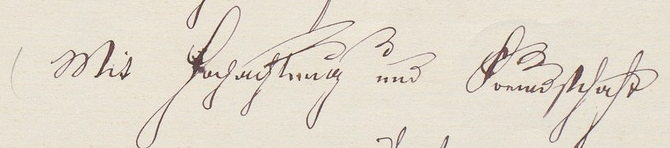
Mit Hochachtung und Freundschaft
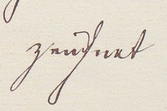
zeichnet
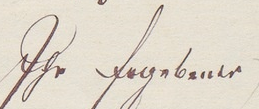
Ihr Ergebener
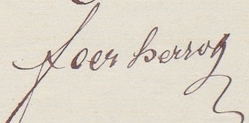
Feer-Herzog
